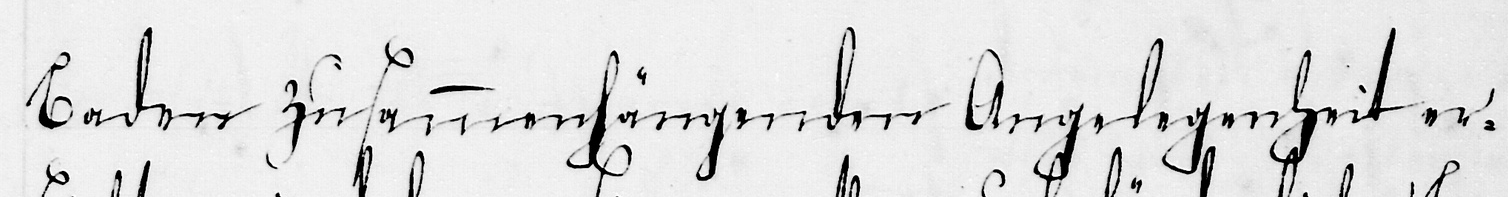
Baden zusammenhängenden Angelegenheit er¬
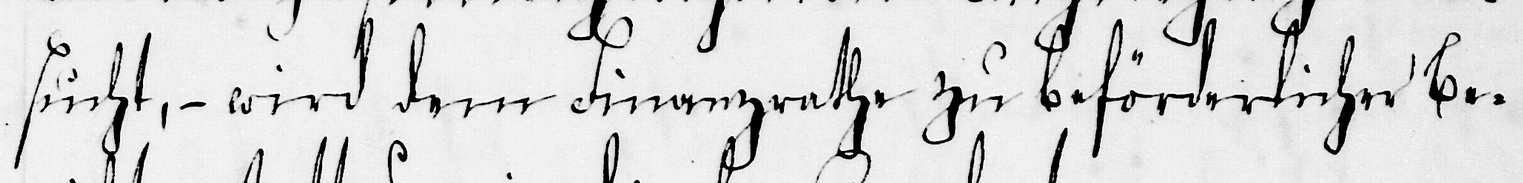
sucht, – wird dem Finanzrathe zu beförderlicher Be¬
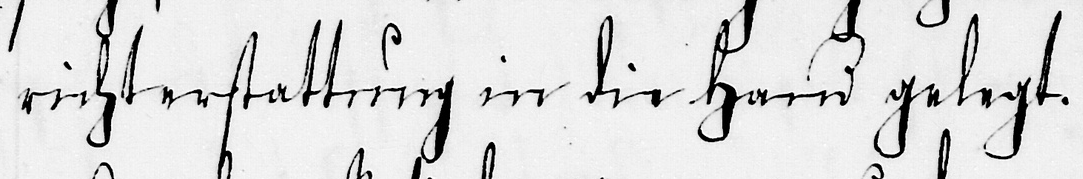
richterstattung in die Hand gelegt.
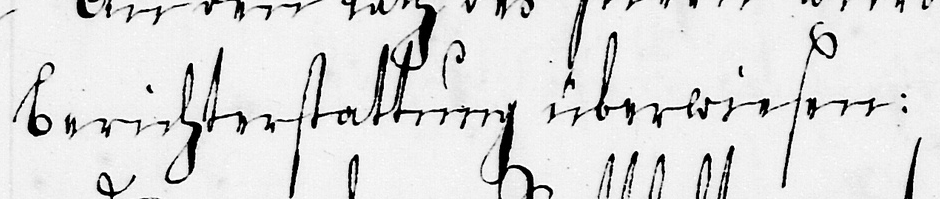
Berichterstattung überwiesen:
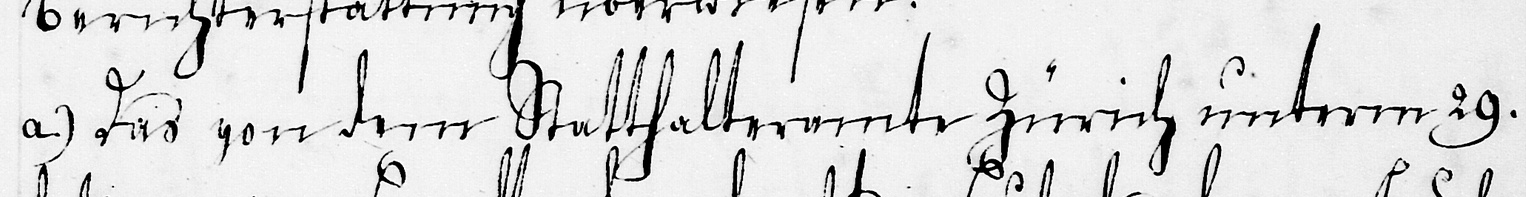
a.) Das von dem Statthalteramte Zürich unterm 29.
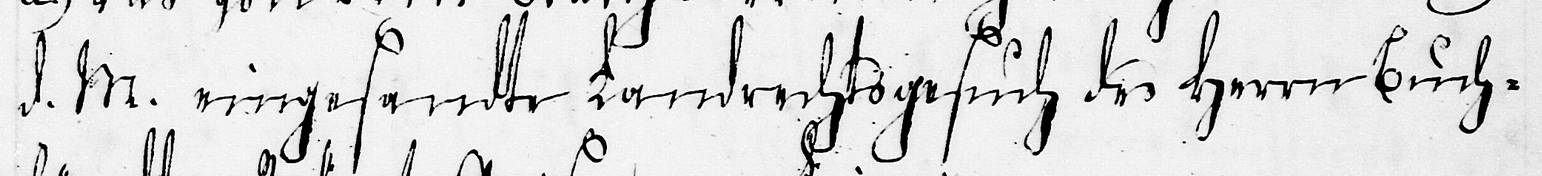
d. M. eingesandte Landrechtsgesuch des Herrn Buch¬
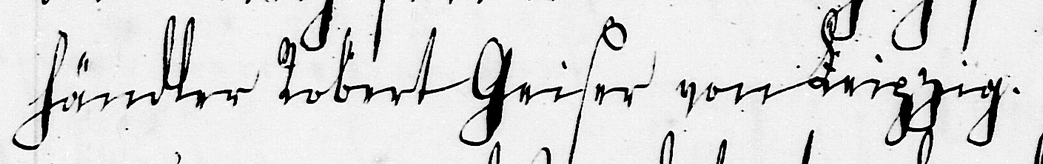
händler Robert Geiser von Leipzig.
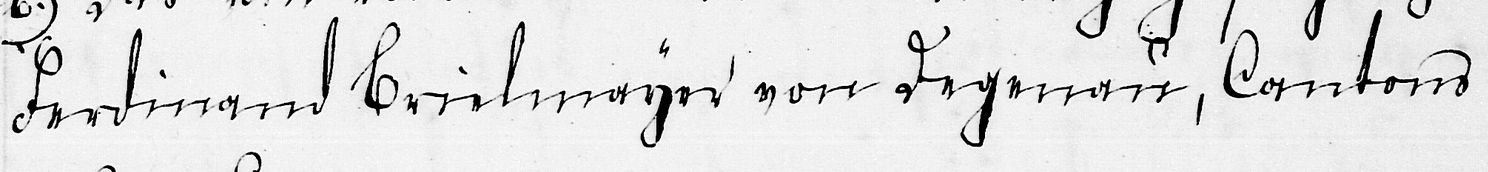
Ferdinand Brielmayer von Degenau, Cantons
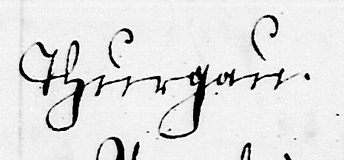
Thurgau.
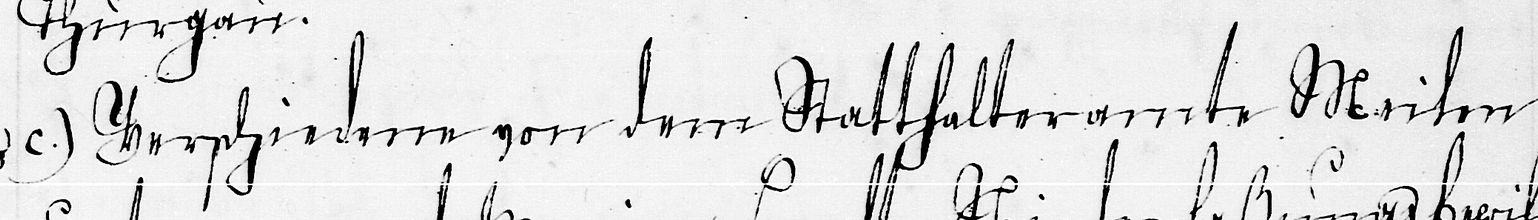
c.) Verschiedene von dem Statthalteramte Meilen
